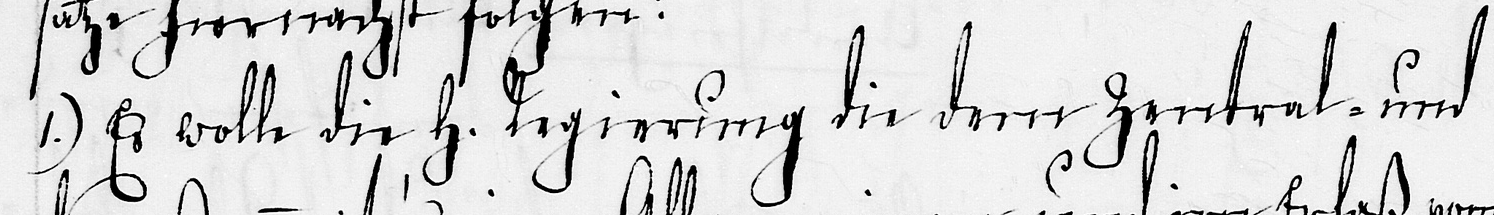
1.) Es wolle die H. Regierung die dem Zentral- und
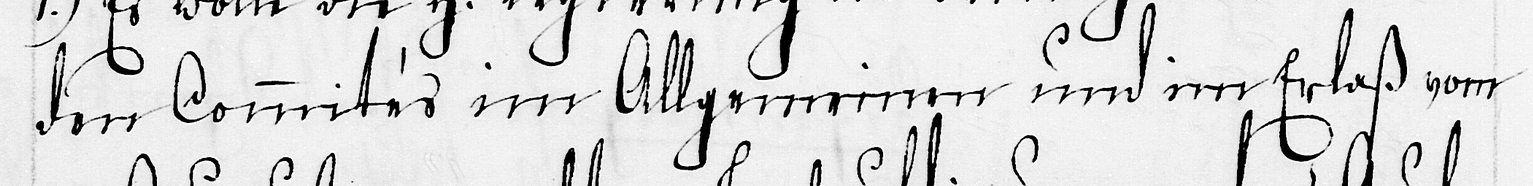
den Commités im Allgemeinen und im Erlaß vom
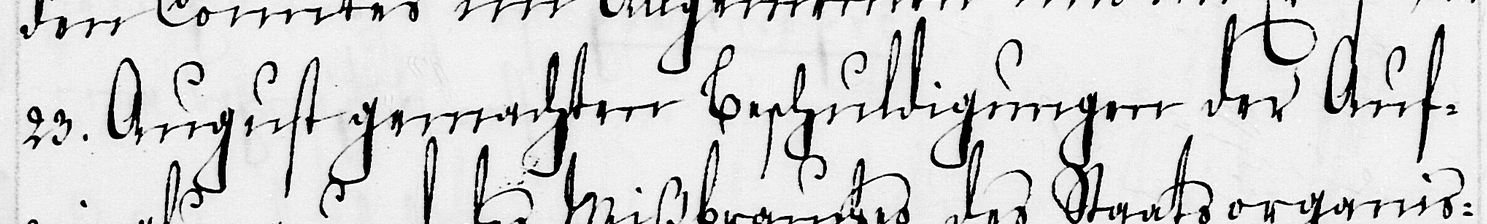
23. August gemachten Beschuldigungen der Auf¬
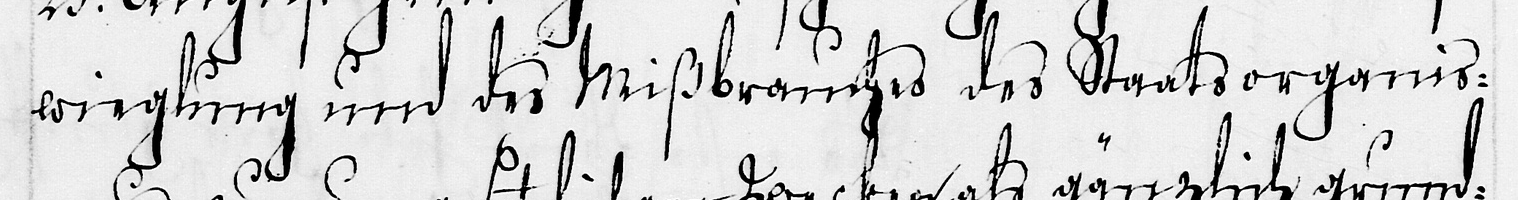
wieglung und des Mißbrauches des Staatsorganis¬
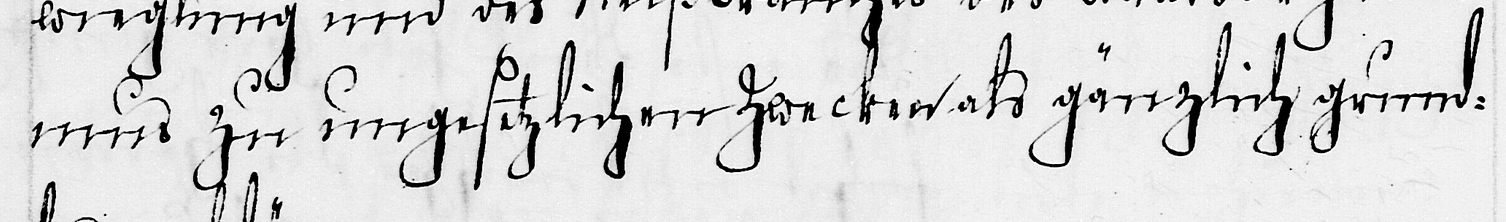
mus zu ungesetzlichen Zwecken als gänzlich grund¬
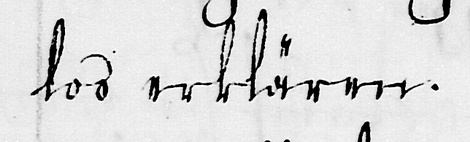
los erklären.
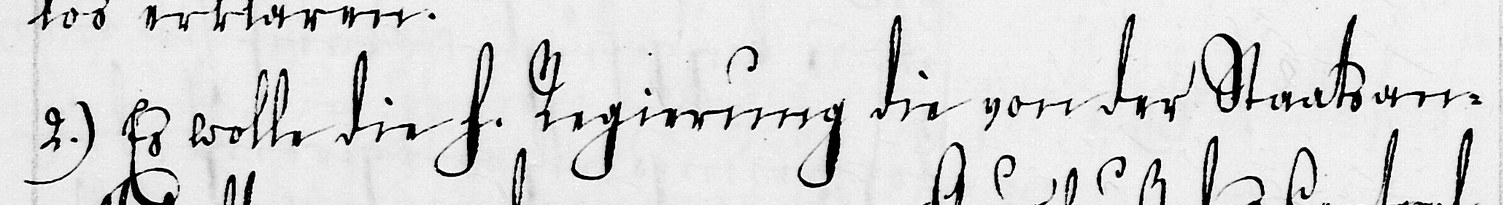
2.) Es wolle die h. Regierung die von der Staatsan¬
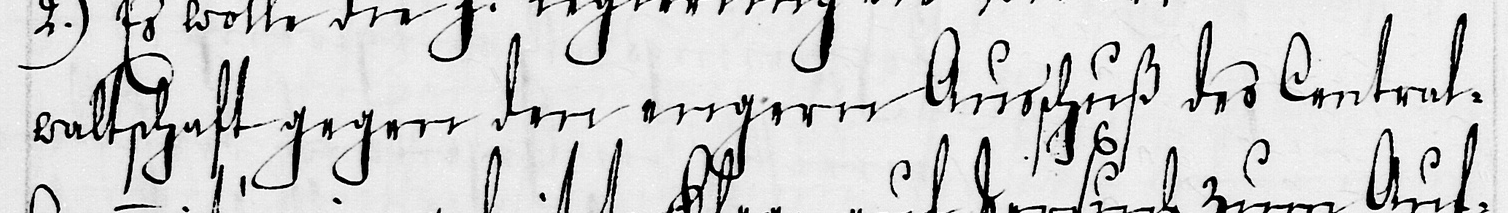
waltschaft gegen den engern Ausschuß des Centra¬
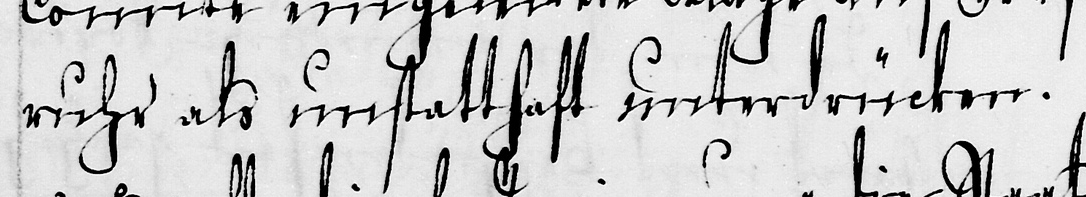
ruhr als unstatthaft unterdrücken.
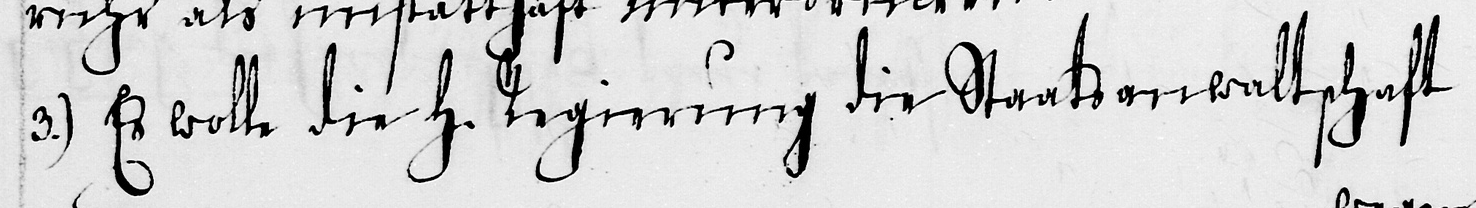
3.) Es wolle die H. Regierung die Staatsanwaltschaft
